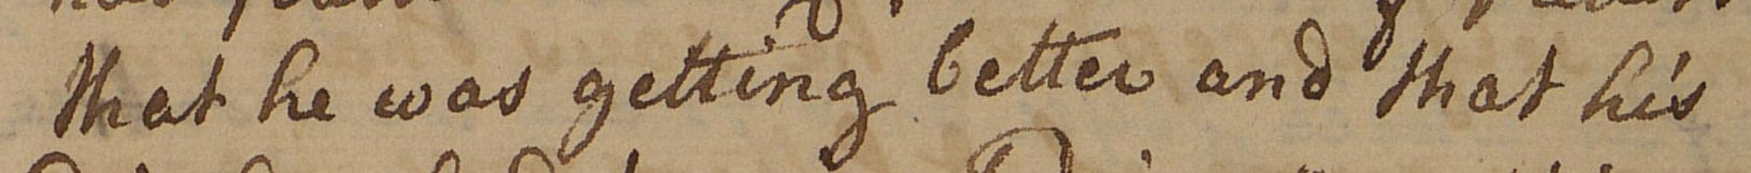that he was getting better and that his
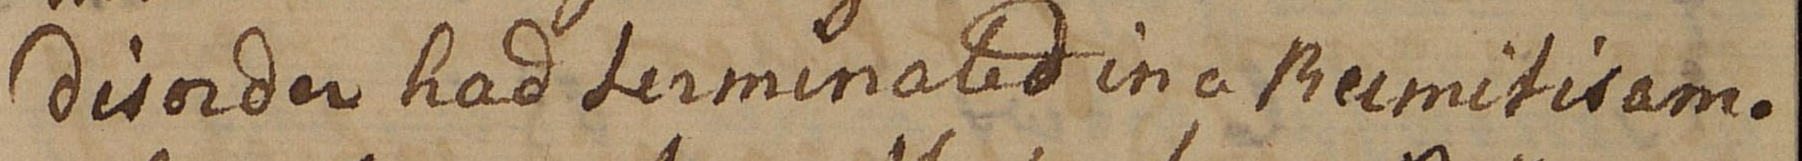disorder had terminated in a Rumitisam.
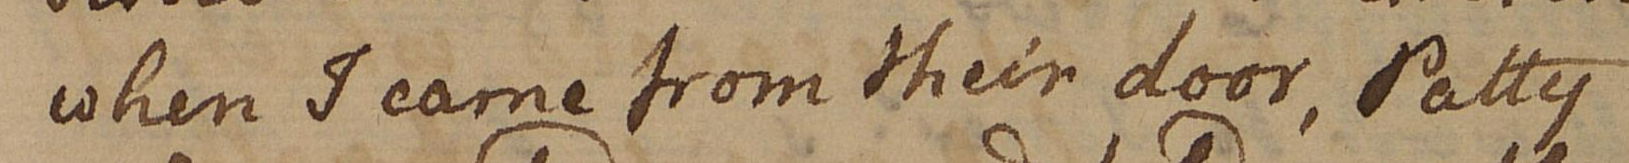when I came from their door, Patty
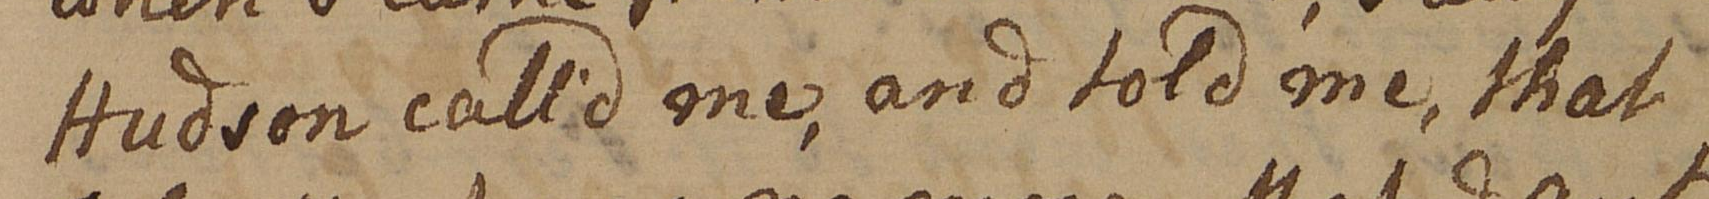Hudson call'd me, and told me, that
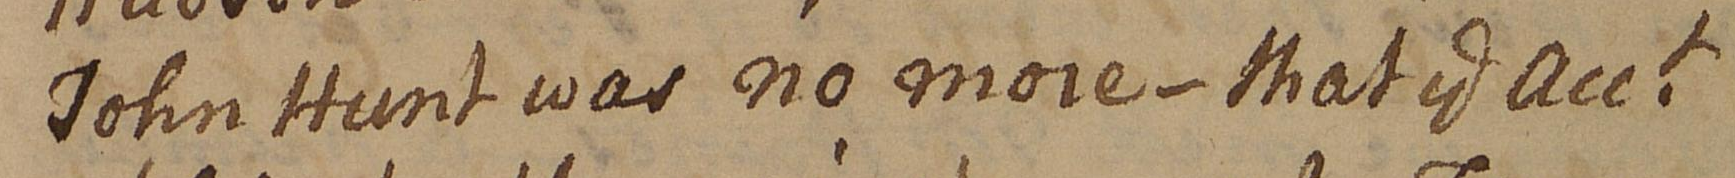John Hunt was no more- that y^e Acc^t.
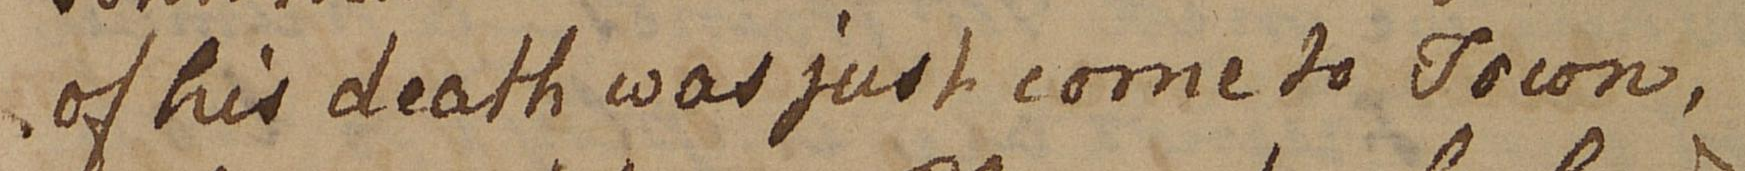of his death was just come to Town,
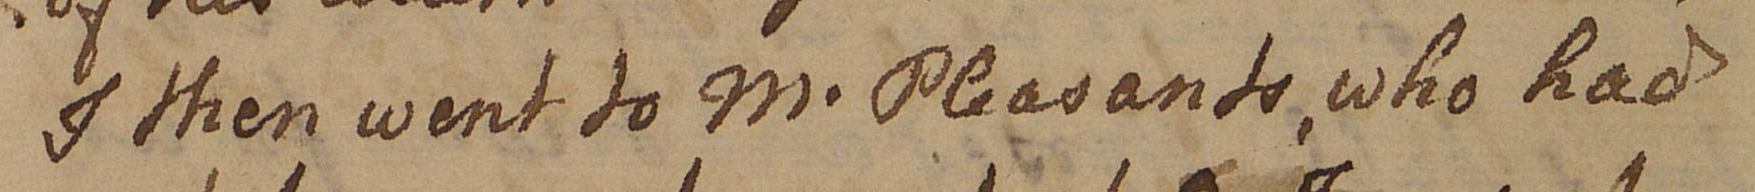I then went to M. Pleasants who had
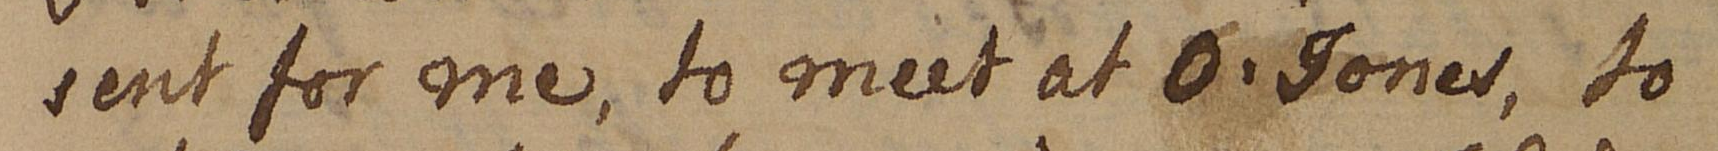sent for me, to meet at O. Jones, to
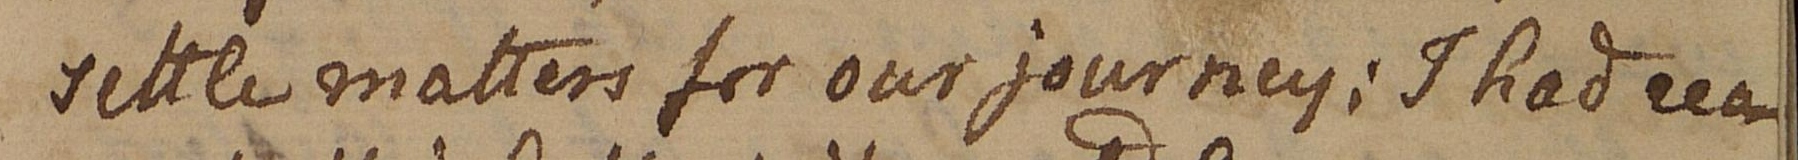settle matters for our journey; I had rea
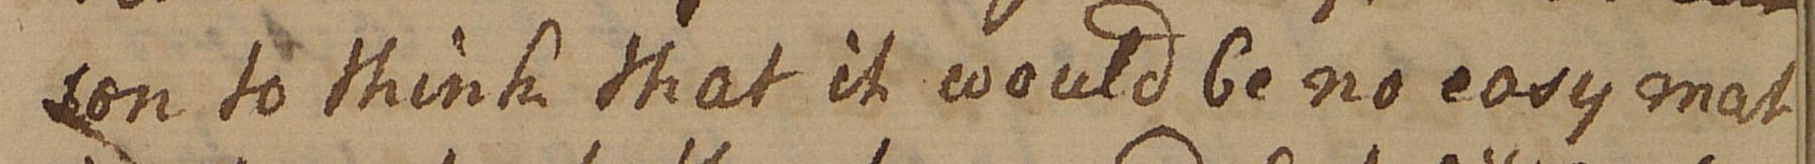son to think that it would be no easy mat
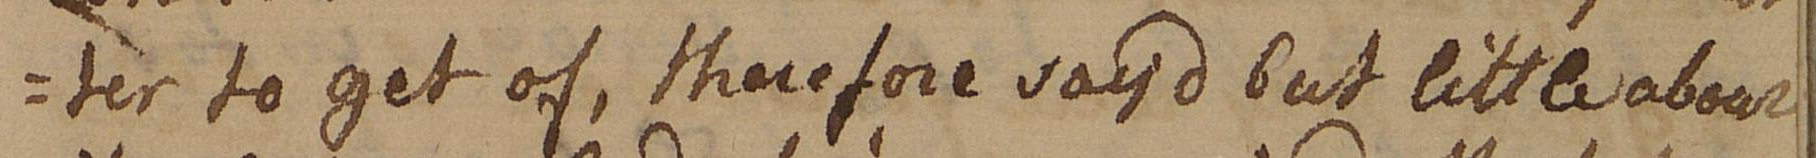-ter to get of, therefore say'd but little about
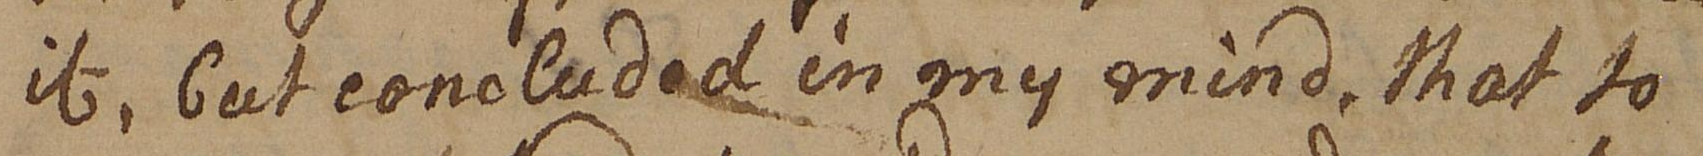it, but concluded in my mind, that to
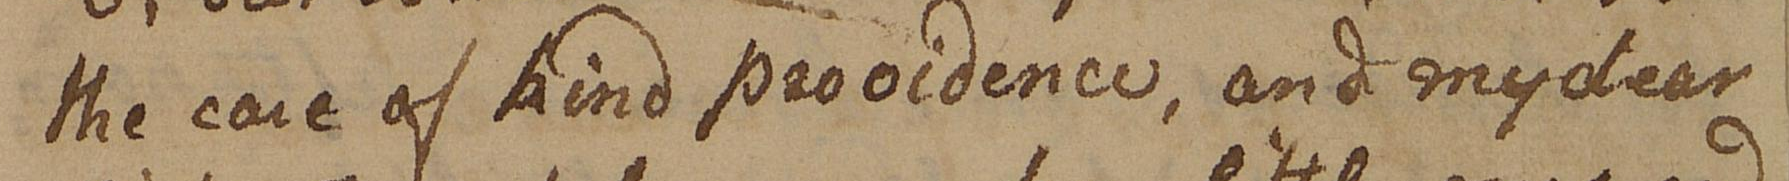the care of kind providence, and my dear
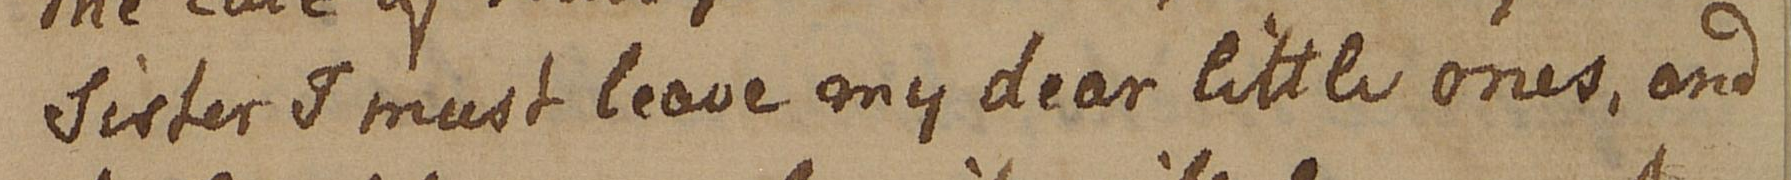Sister I must leave my dear little ones, and
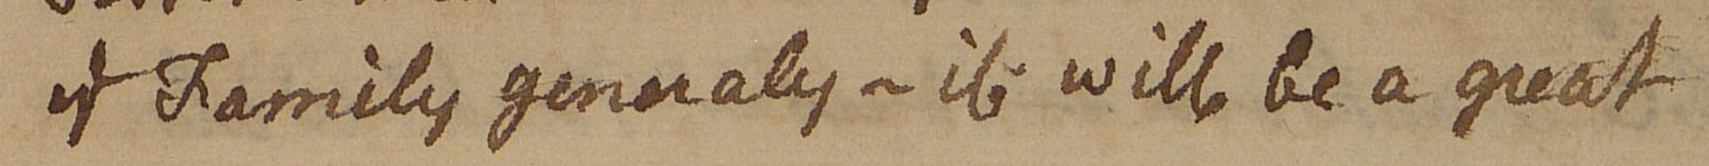y^e Family generaly- it will be a great
